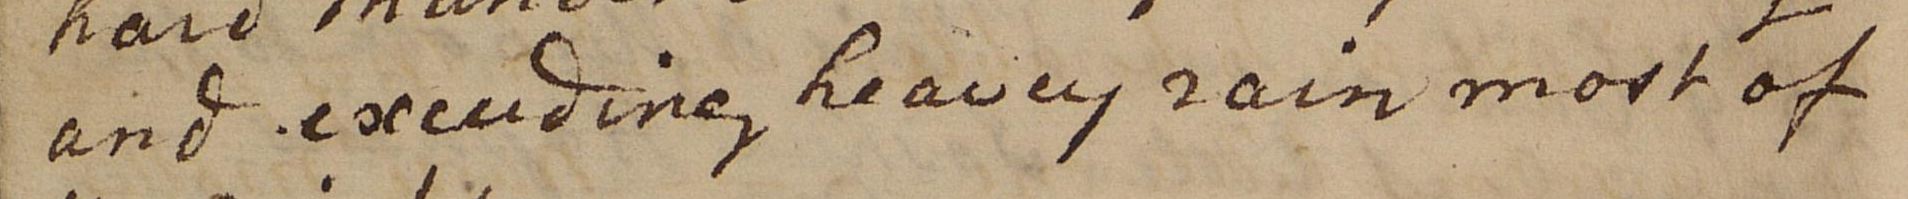and excuding heavey rain most of
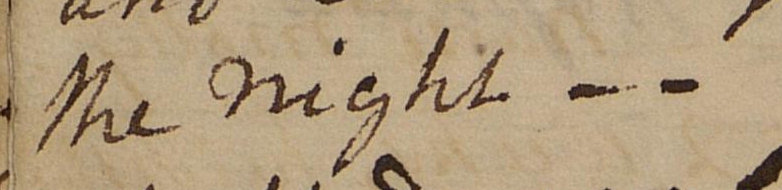the Night--
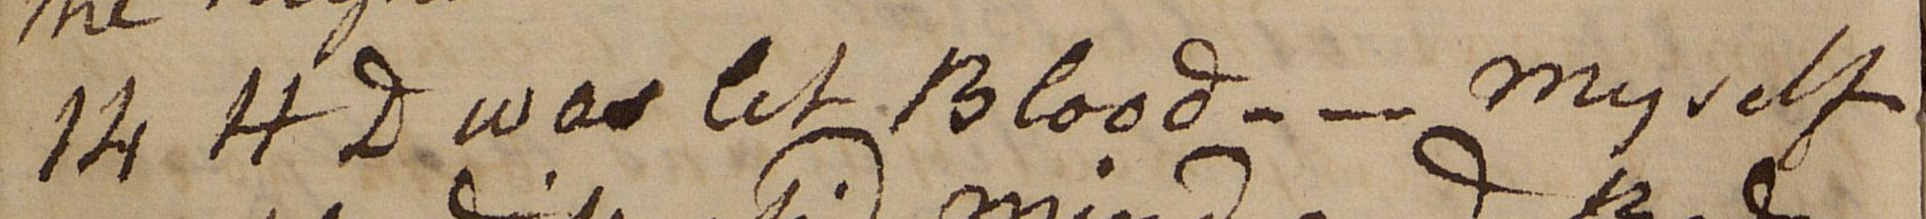14 HD was let Blood-- myself
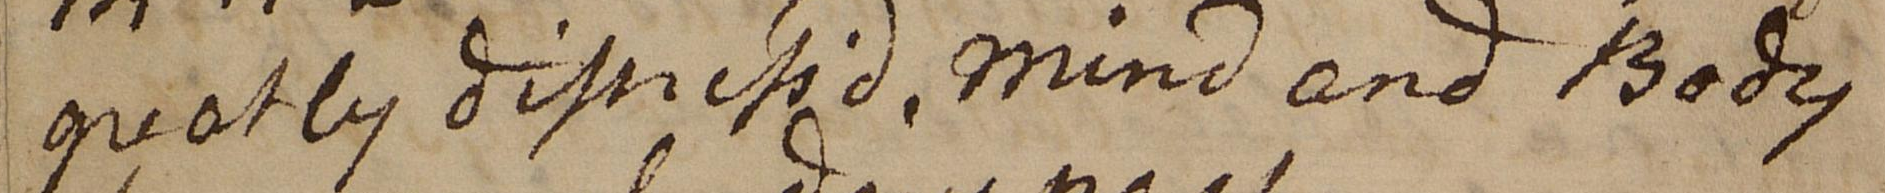greatly distress'd, mind and Body
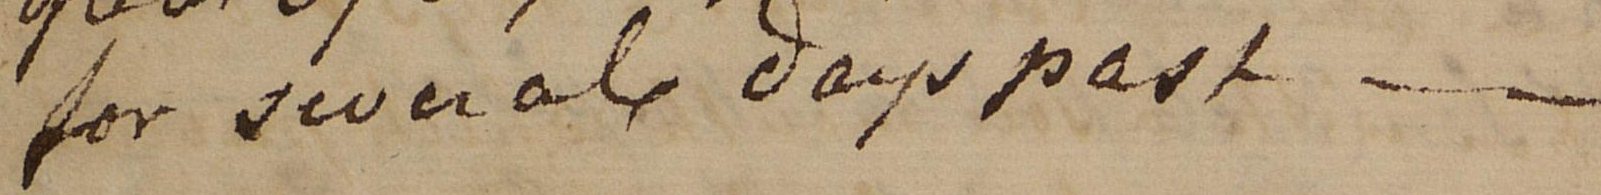for several days past-
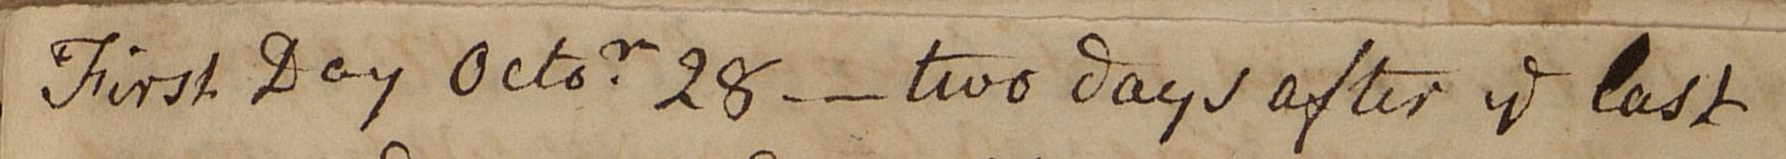First Day Octo^r 28-- two days after y^e last
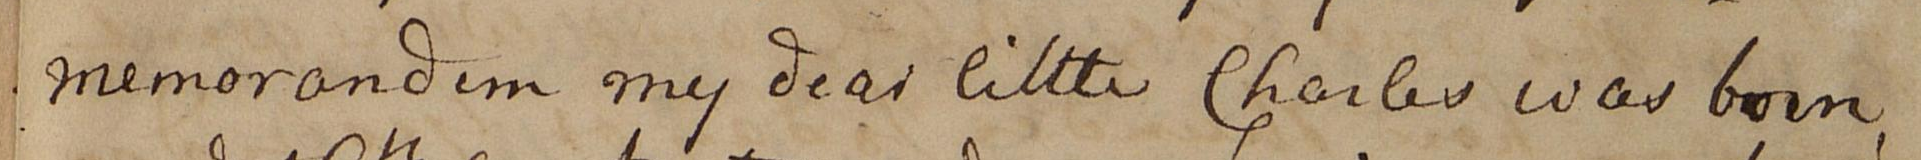memorandum my dear liltte Charles was born
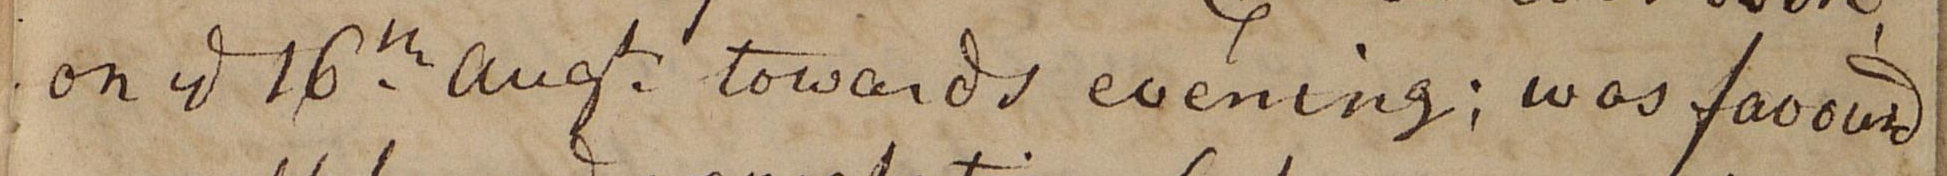on y^e 16^th Aug^t. towards evening; was favourd
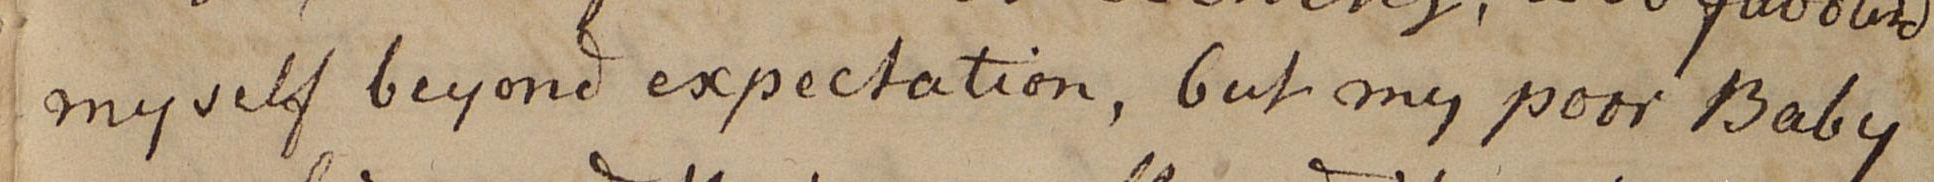myself beyond expectation, but my poor Baby
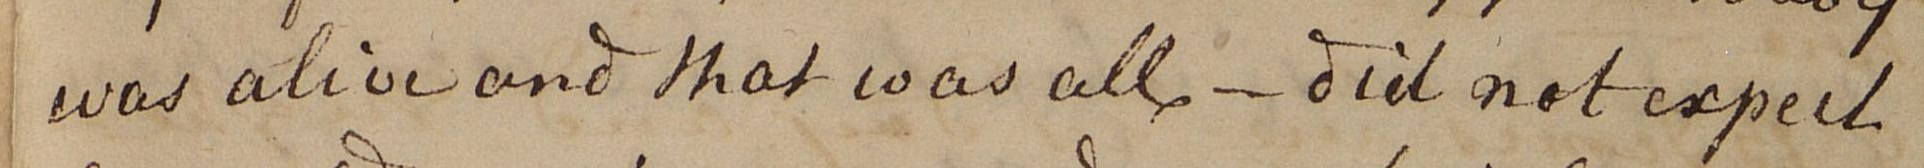was alive and that was all- did not expect
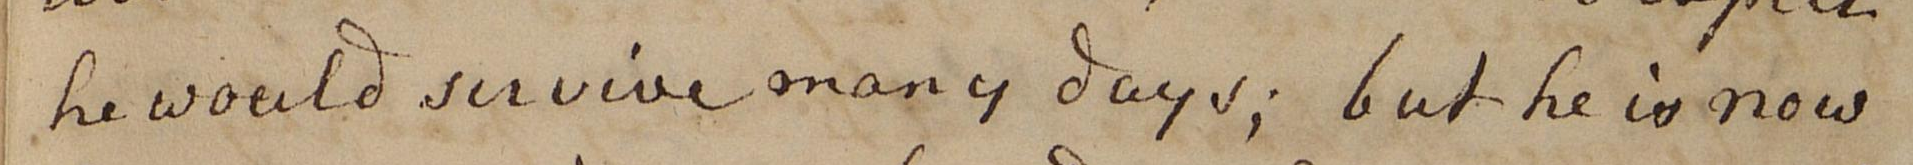he would survive many days; but he is now
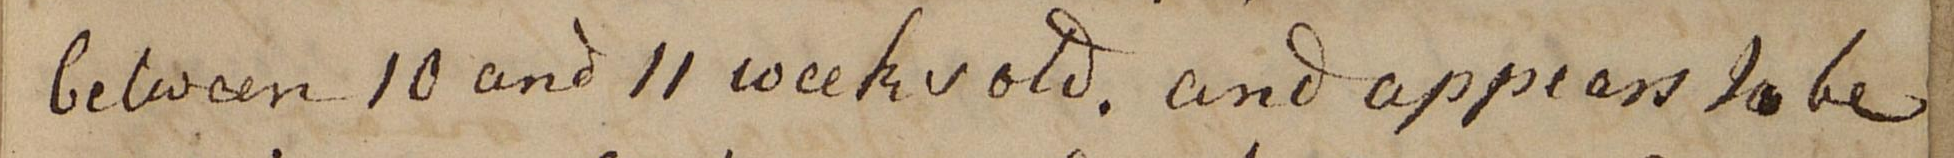between 10 and 11 week sold, and appears to be
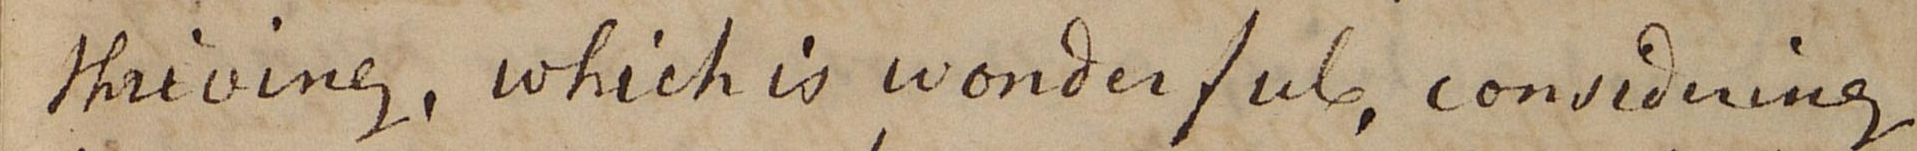thriving, which is wonderful, considering
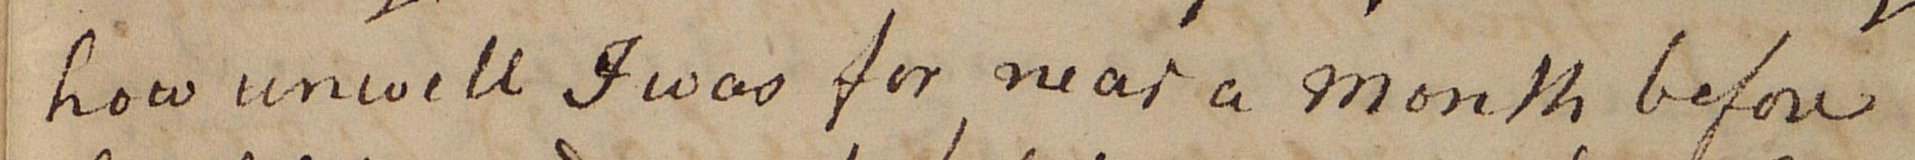how unwell I was for near a month before
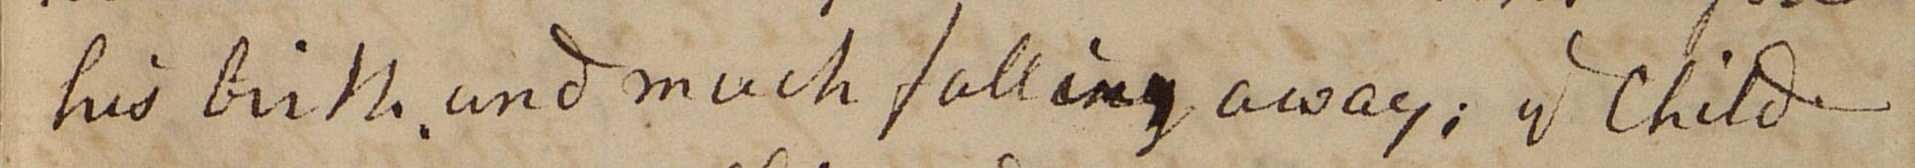his birth and much falling away; y^e Child
